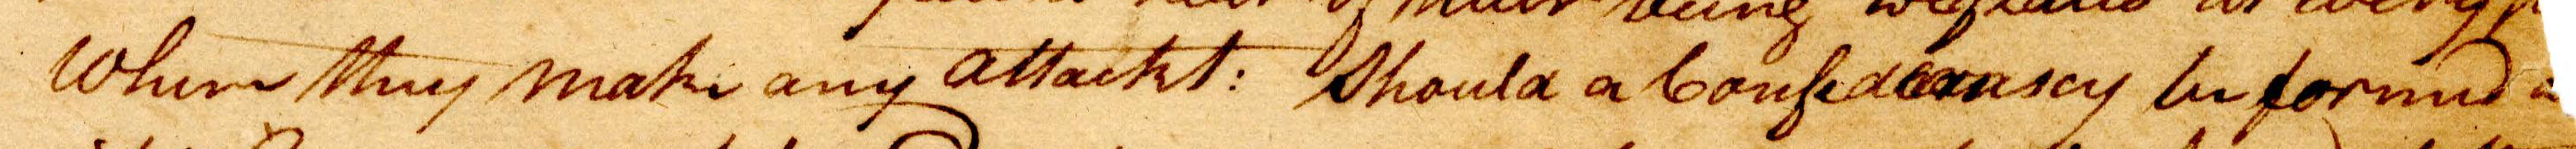Where they make any Attacks: Should a Confederacy be formed a
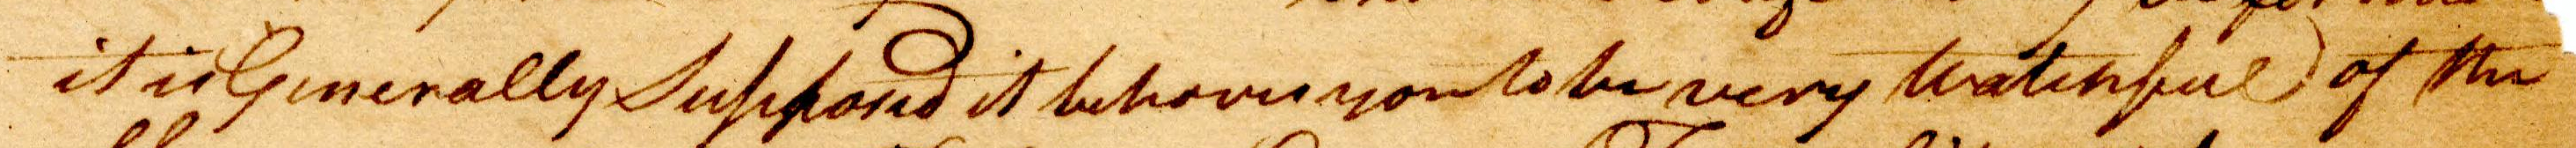it is Generally Supposed it behoves you to be very Watchful of the
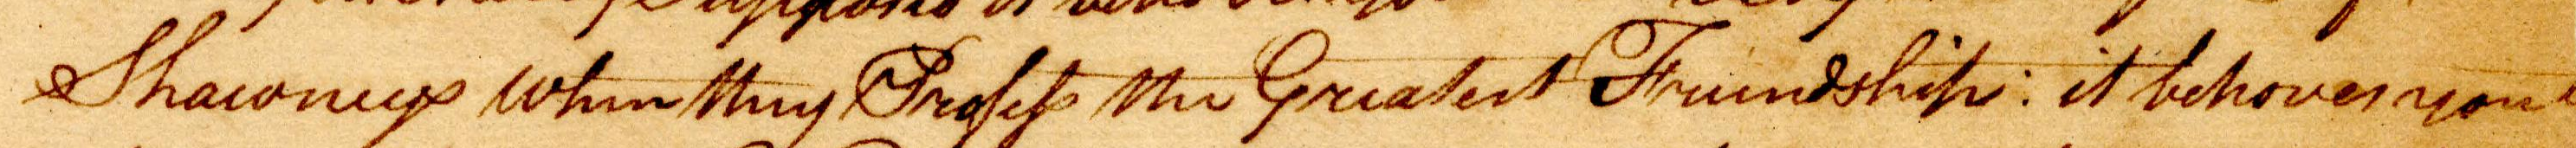Shawneys when they Profess the Greatest Friendship: it behoves you
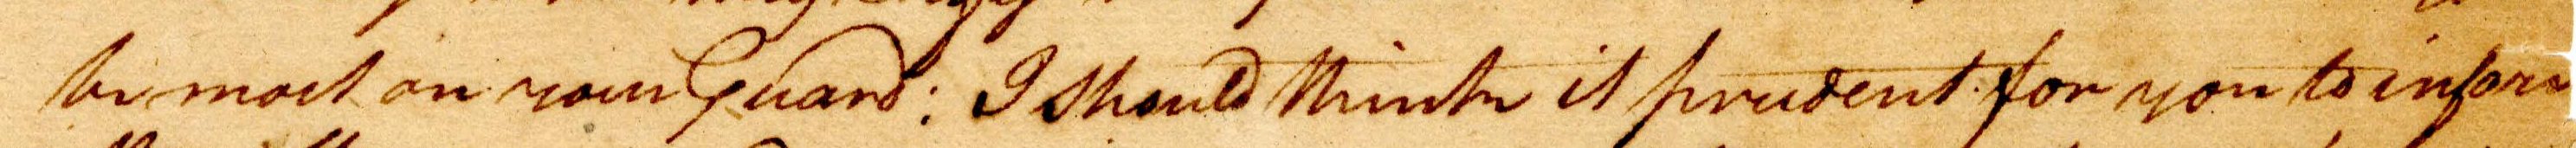be most on your Guard: I should think it prudent for you to inform
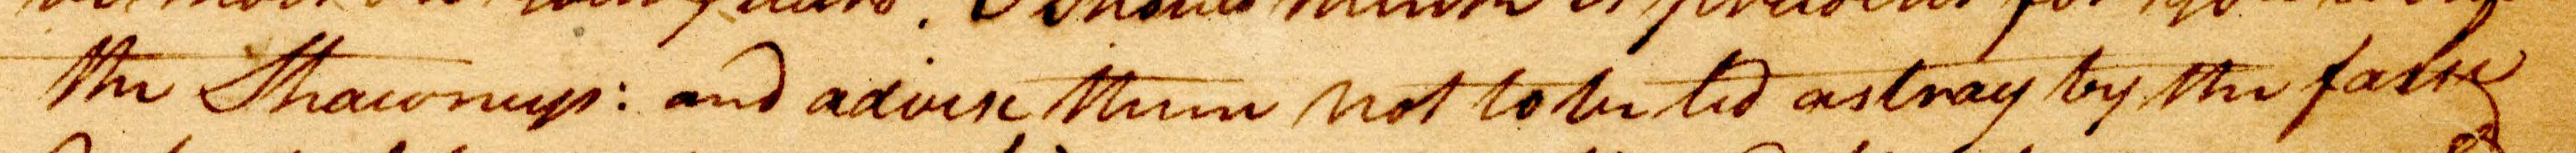the Shawneys: and advise them not to be led astray by the false
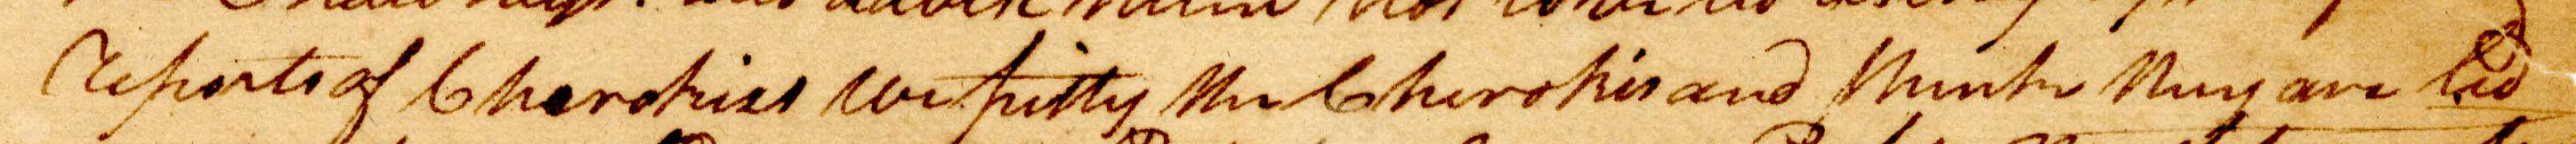reports of Cherokies we pitty the Cherokies and think they are led
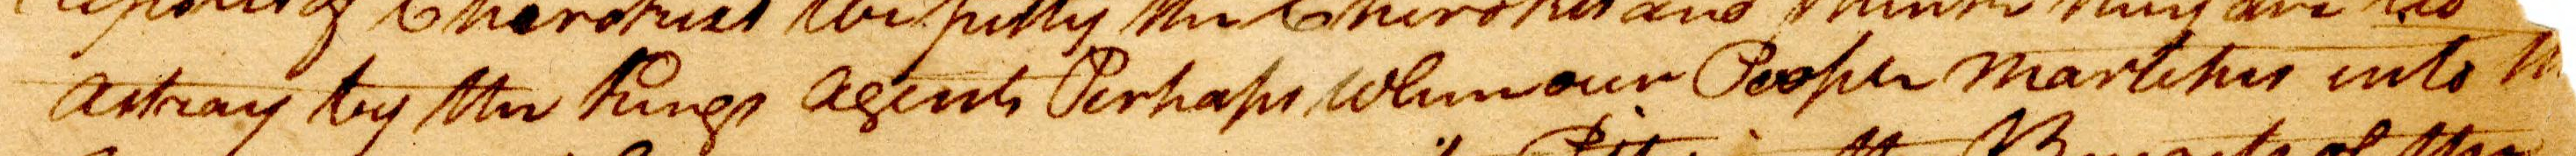Astray by the Kings agents Perhaps when our People Marches into
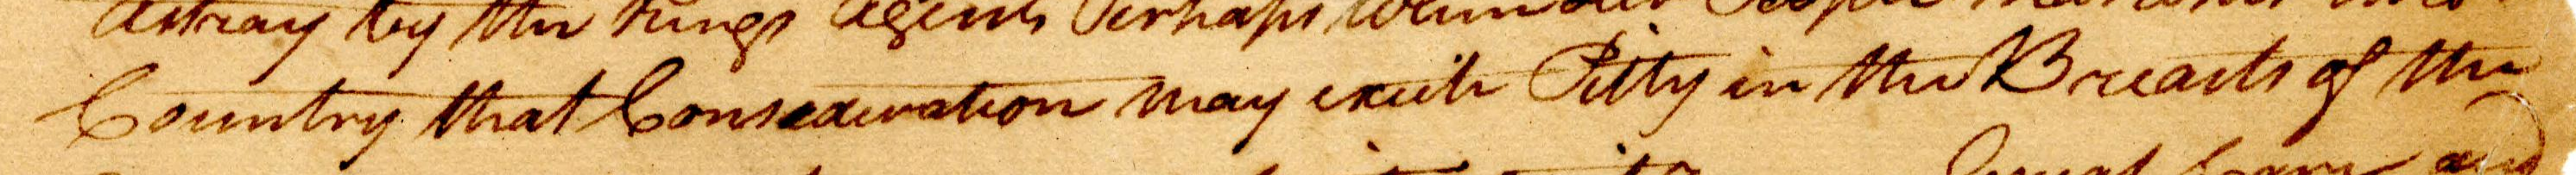Country that Conservation may excite Pitty in the Breasts of the
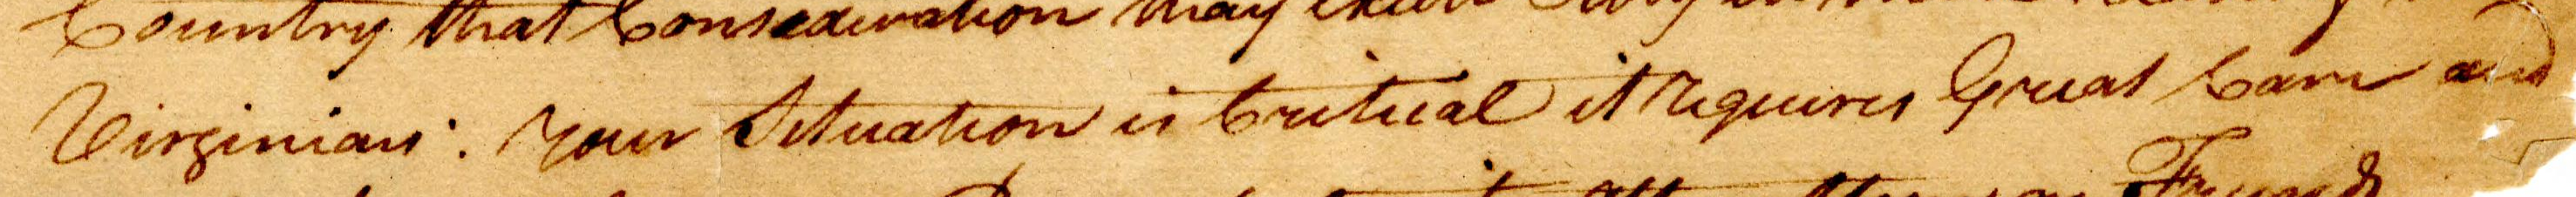Virginians. Your Situation is Critical it requires Great Care and
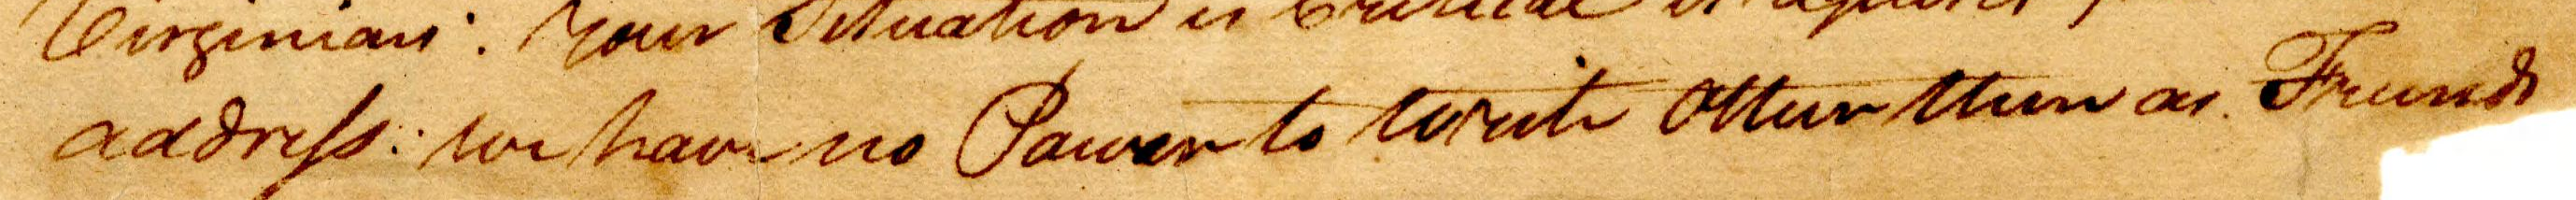address: we have no Power to write other than as Friends
